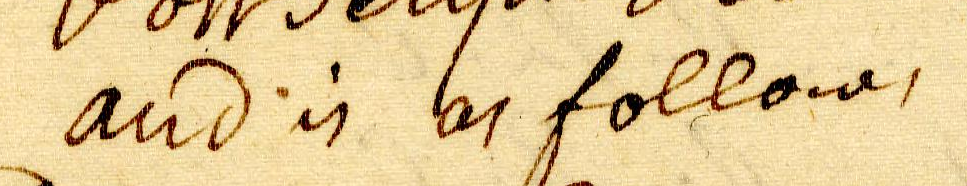and is as follows
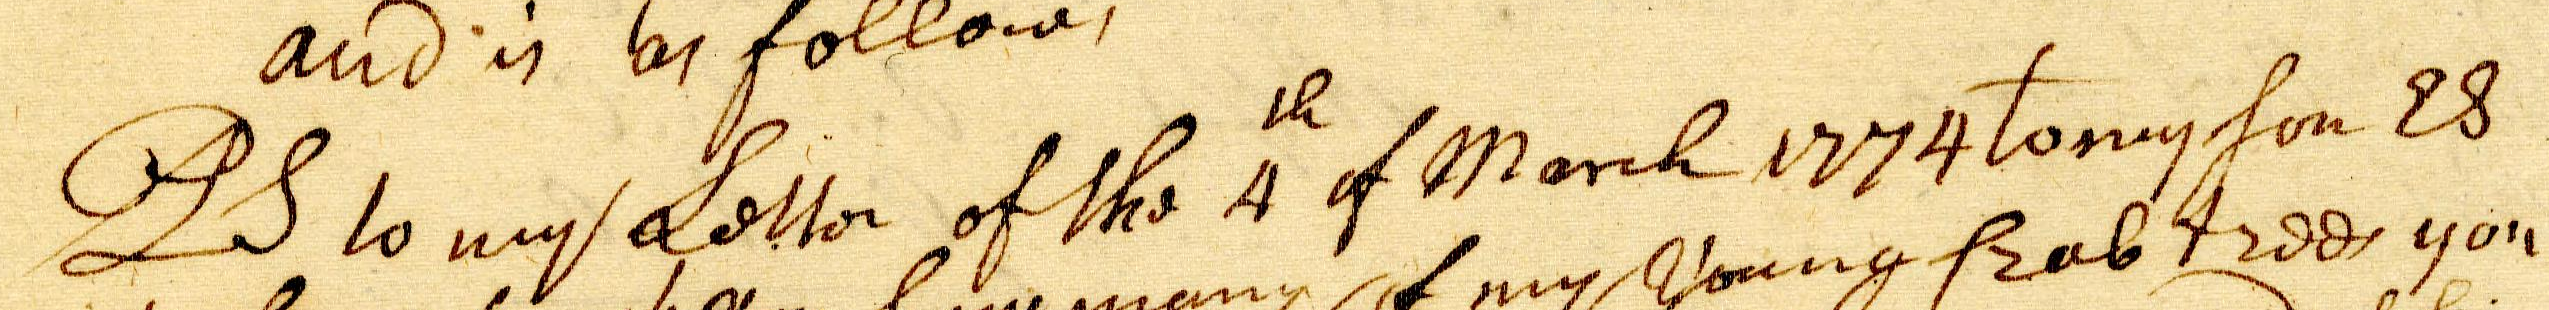PS to my Letter of the 46th of March 1774 to my son ES
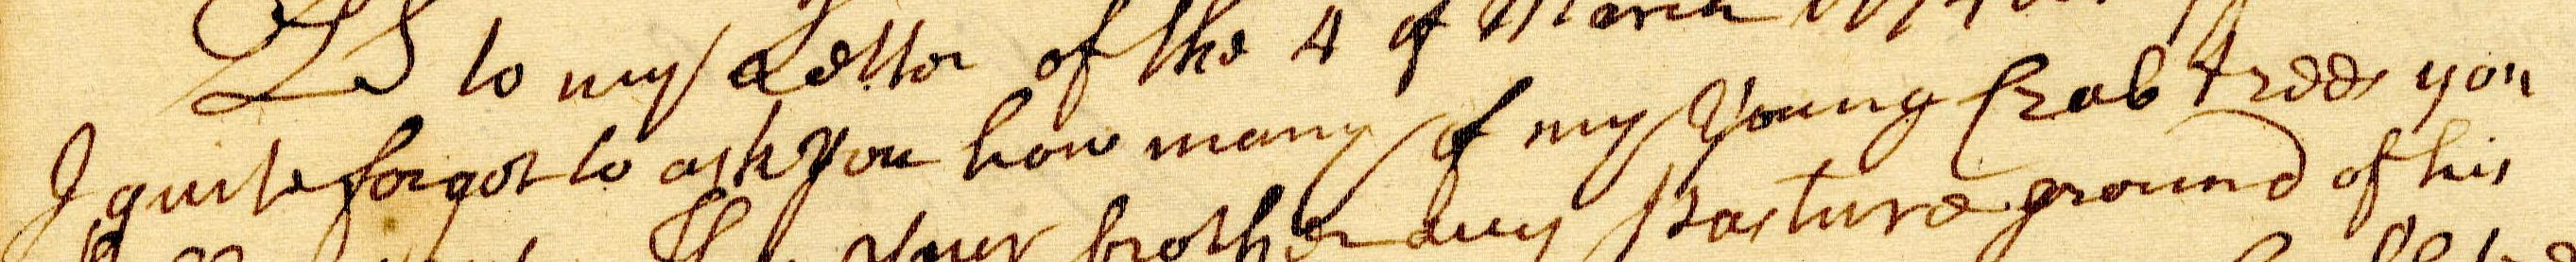I quite forgot to ask you how many of my Young Crabtrees you
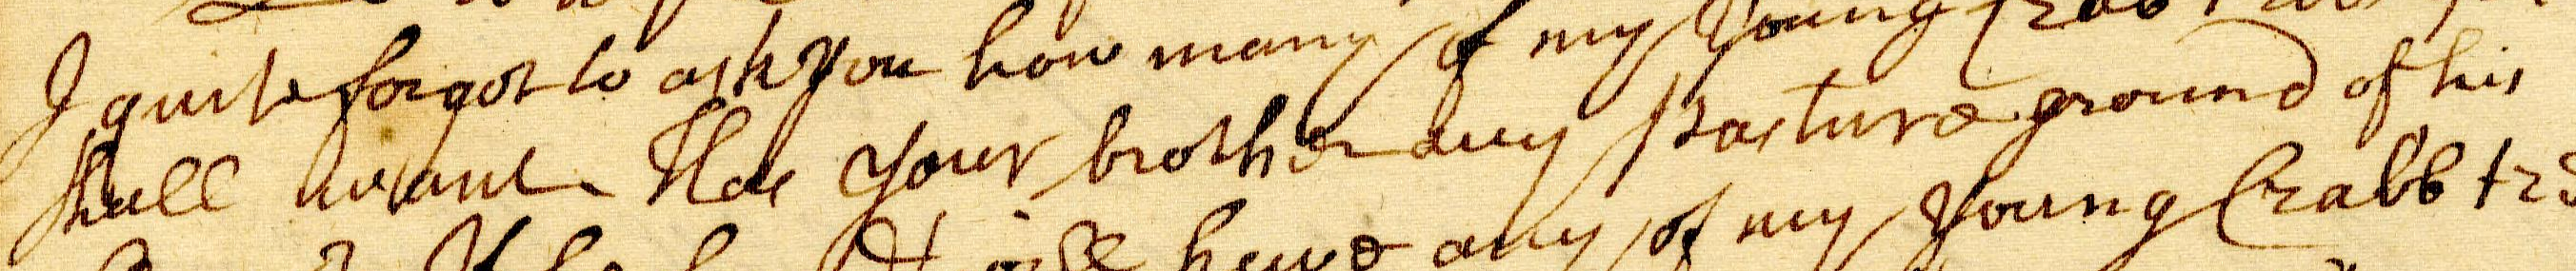shall want. Has your brother any pasture ground of his
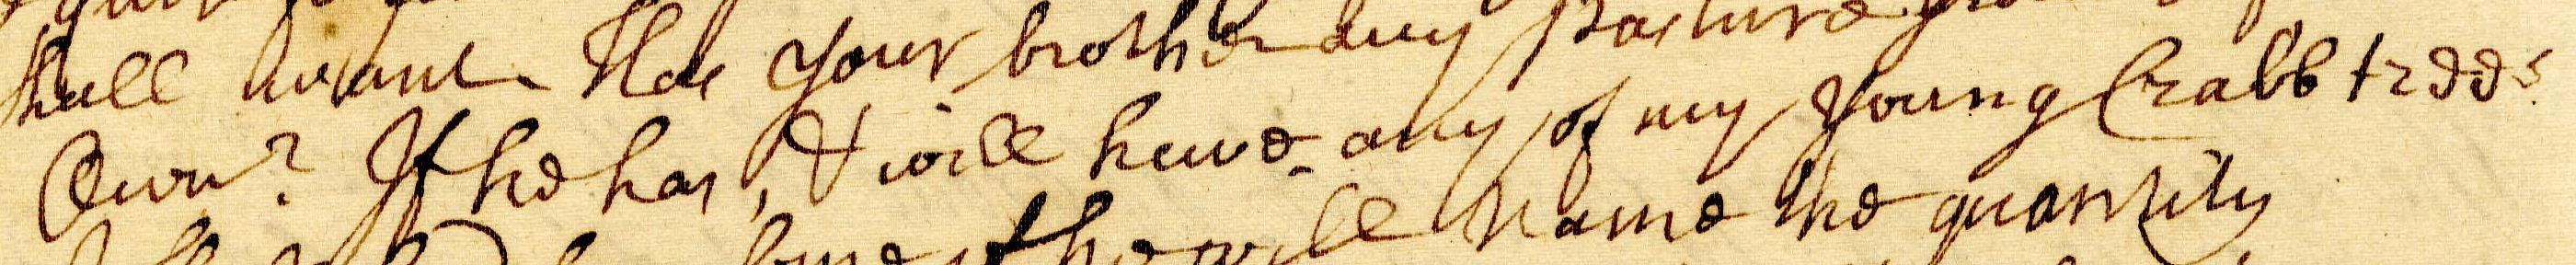Own? If he has, per will have any of my Young Crabtrees
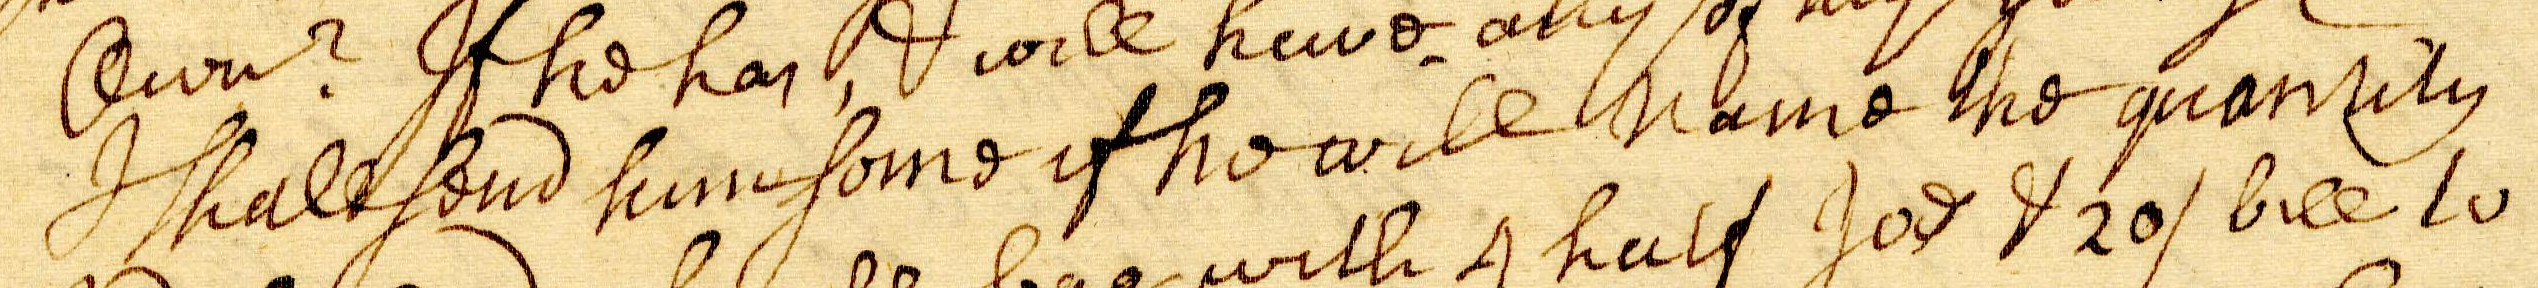I shall send him some if he will name the quantity
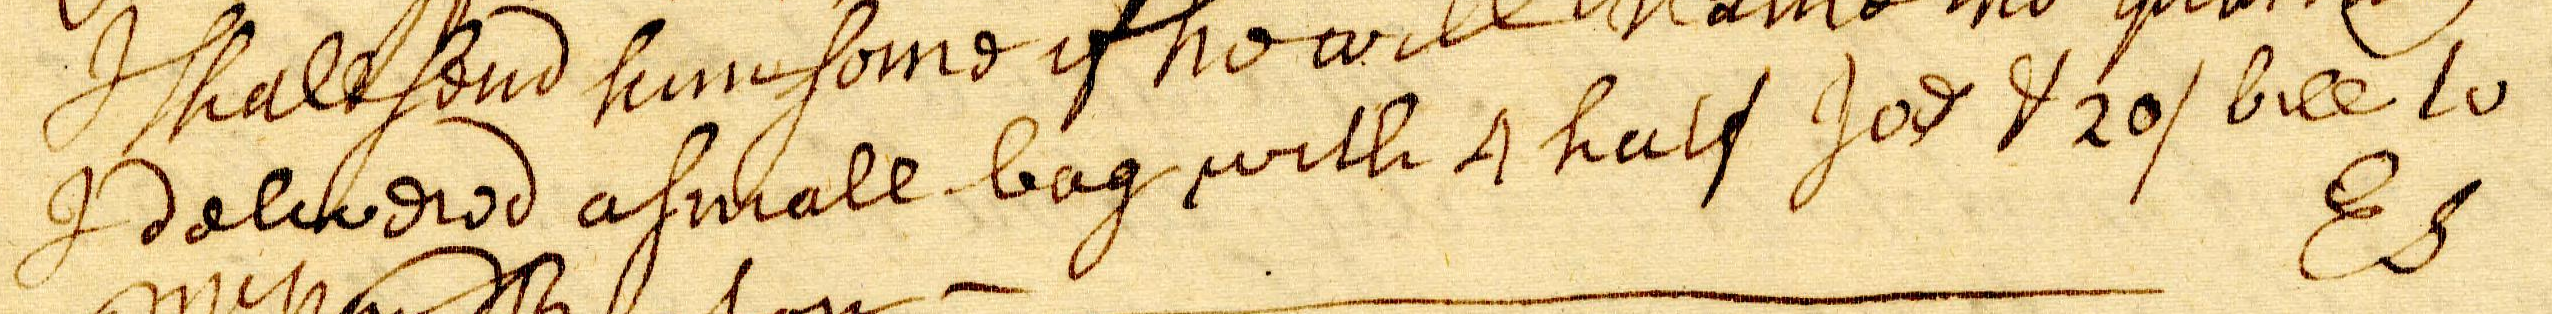I delivered a small bag with 4 half Joes per 20s bill to
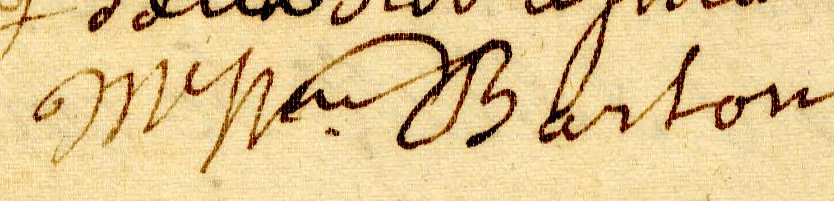M^r W^m. Barton
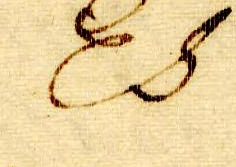ES
